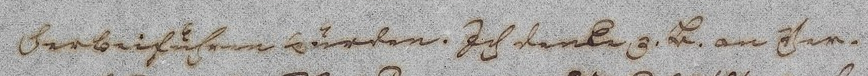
herbeiführen würden. Ich denke z. B. an Ver-
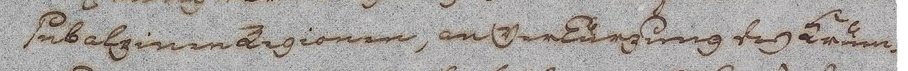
subalpinen Regionen, an Verkürzung des Krüm-
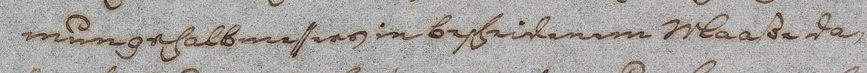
mungshalbmessers in bescheidenem Maaße da,
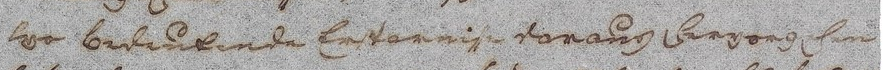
wo bedeutende Ersparnisse daraus hervorgehen
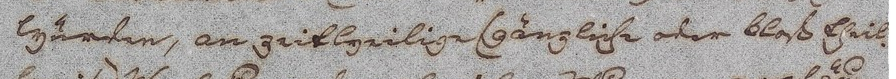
würden, an zeitweilige (gänzliche oder bloß theil-
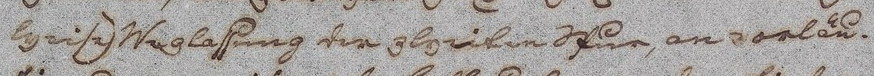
weise) Weglassung der zweiten Spur, an vorläu-
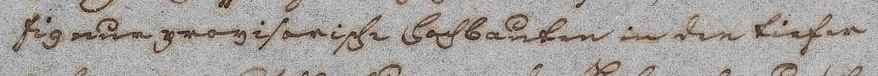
fig nur provisorische Hochbauten in den tiefer
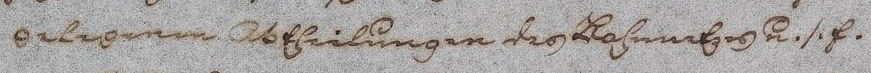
gelegenen Abtheilungen des Bahnnetzes u. s. f.
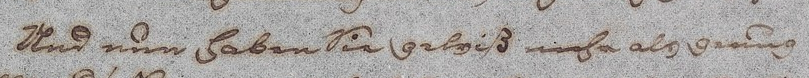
Und nun haben Sie gewiß mehr als genug
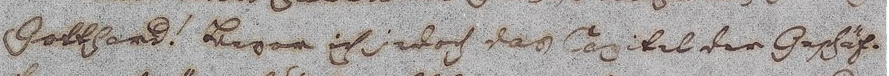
Gotthard! Bevor ich jedoch das Capitel der Geschäf-
